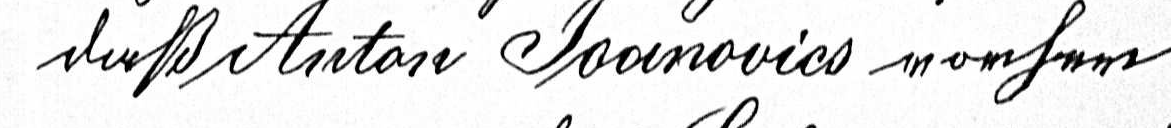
daß Anton Ioanovics vorher
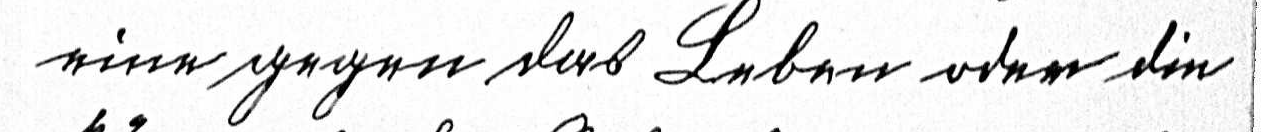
eine gegen das Leben oder die
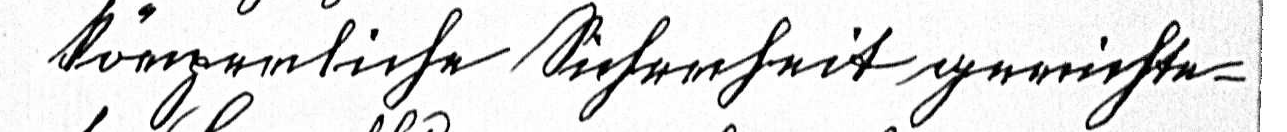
körperliche Sicherheit gerichte¬
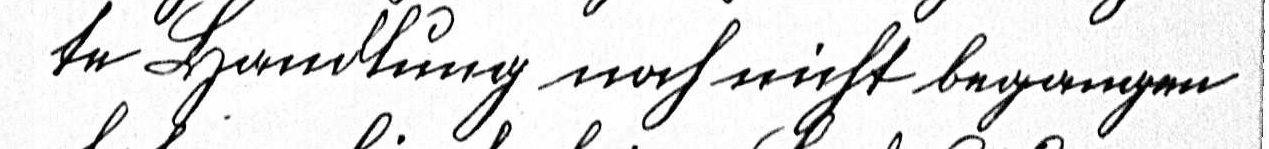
te Handlung noch nicht begangen
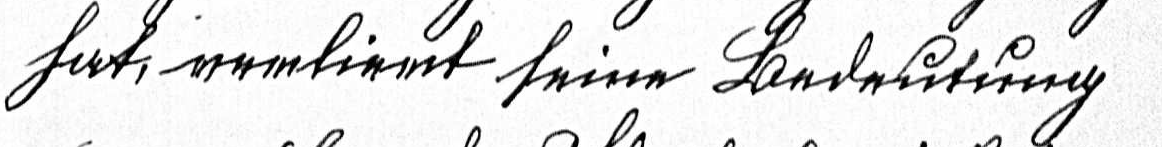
hat, verliert seine Bedeutung
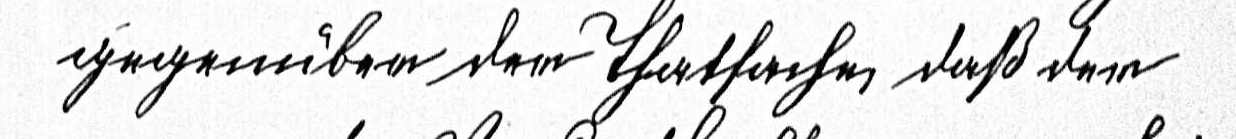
gegenüber der Thatsache, daß der
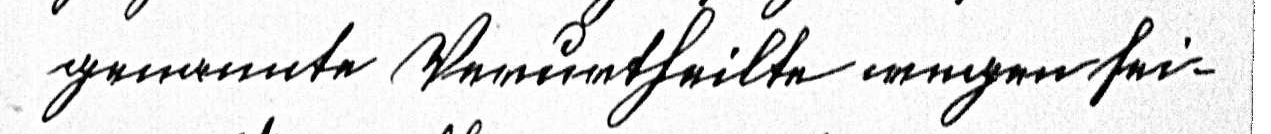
genannte Verurtheilte wegen sei¬
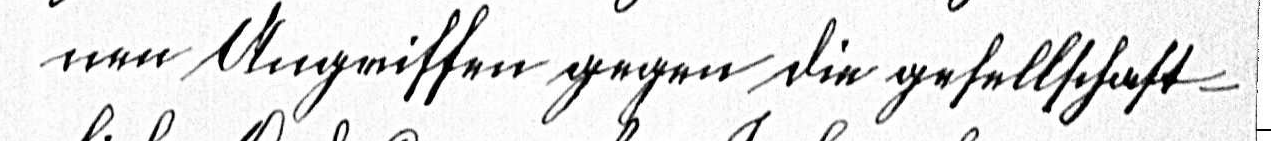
nen Angriffen gegen die gesellschaft¬
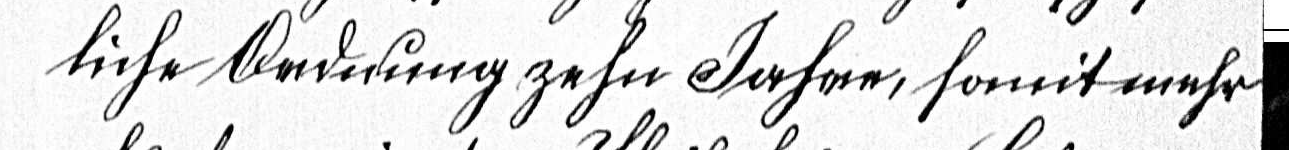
liche Ordnung zehn Jahre, somit mehr
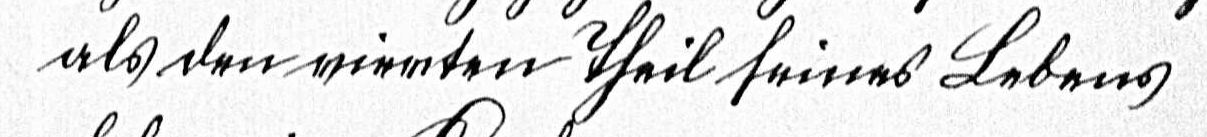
als den vierten Theil seines Lebens,
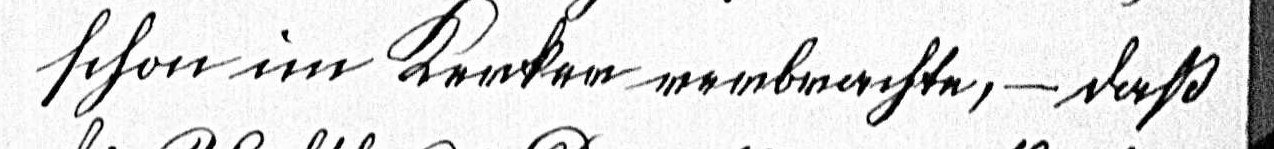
schon im Kerker verbrachte, daß
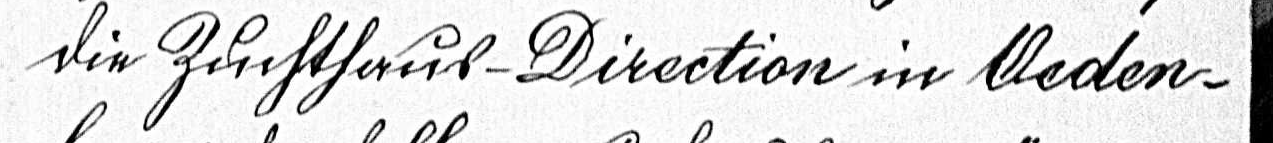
die Zuchthaus-Direction in Oeden¬
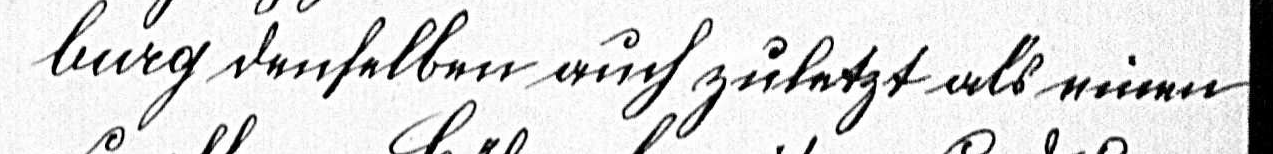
burg denselben auch zuletzt als einen
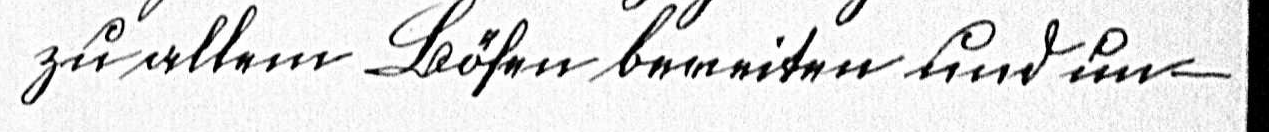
zu allem Bösen bereiten und un¬
